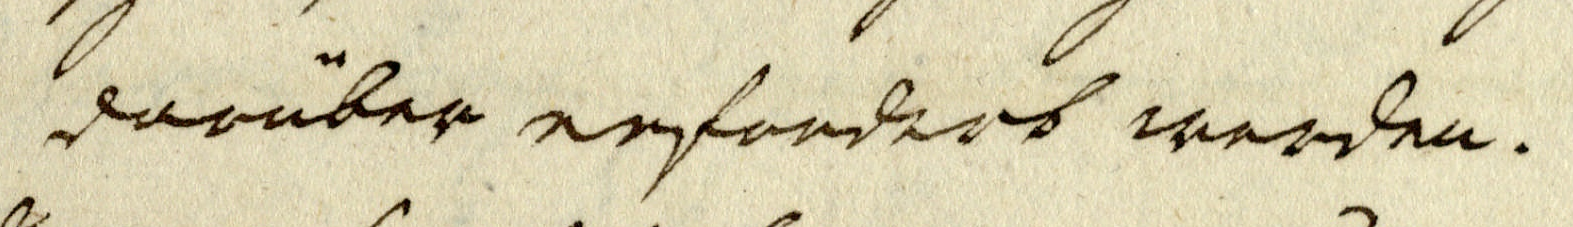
darüber erfordert werden.
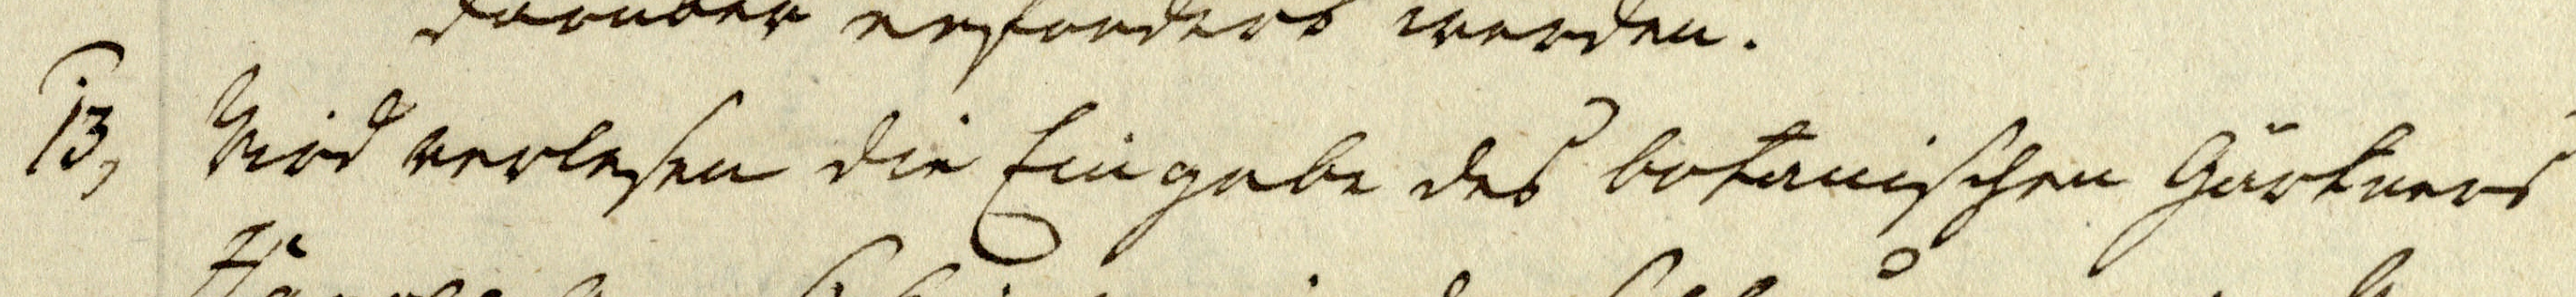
13., Wird verlesen die Eingabe des botanischen Gärtners
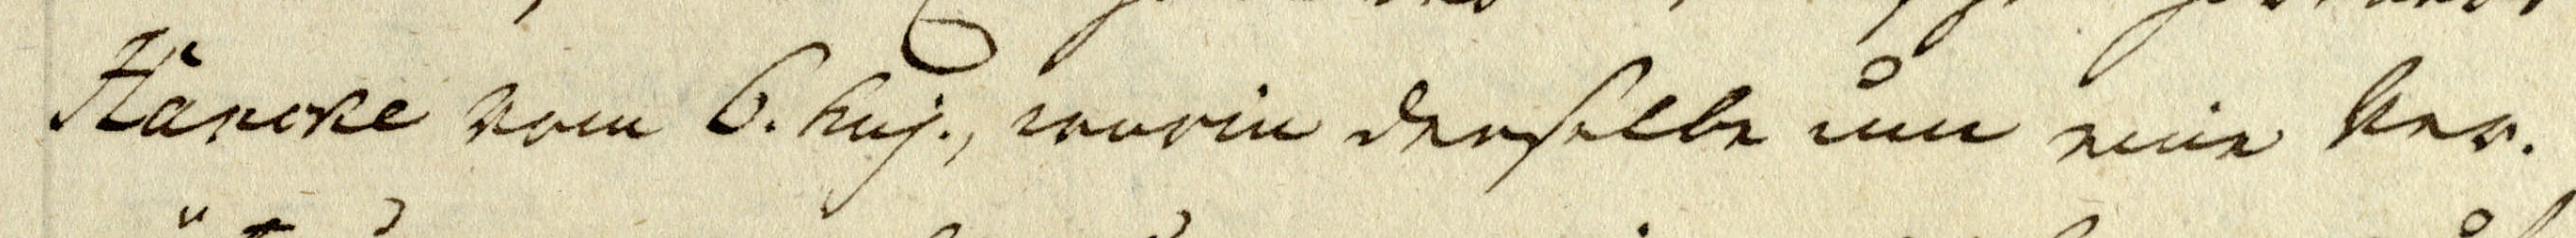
Hancke vom 6. huj., worin derselbe um eine Ver¬
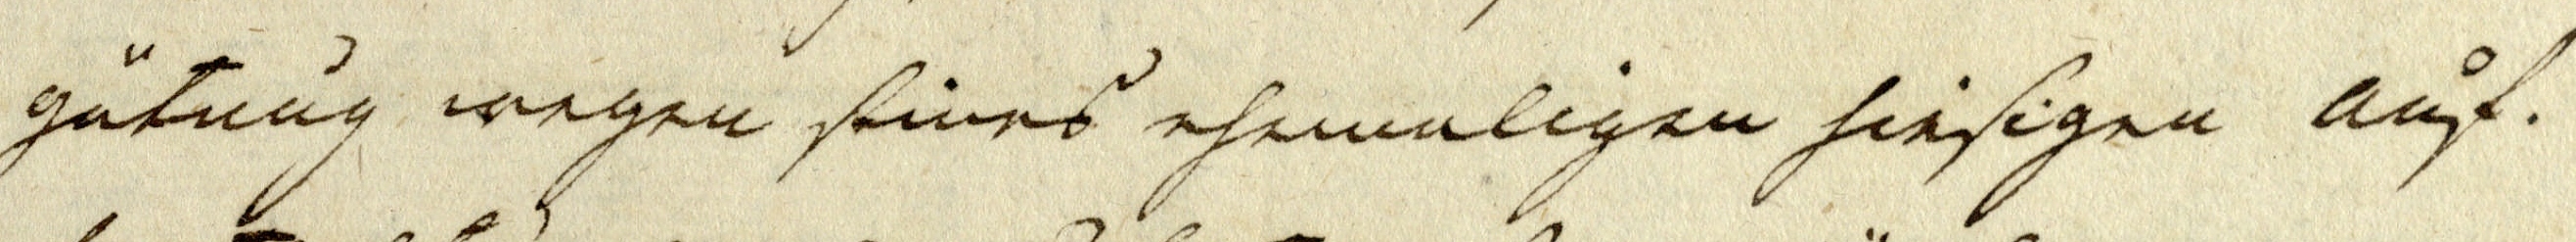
gütung wegen seines ehemaligen hiesigen Auf¬
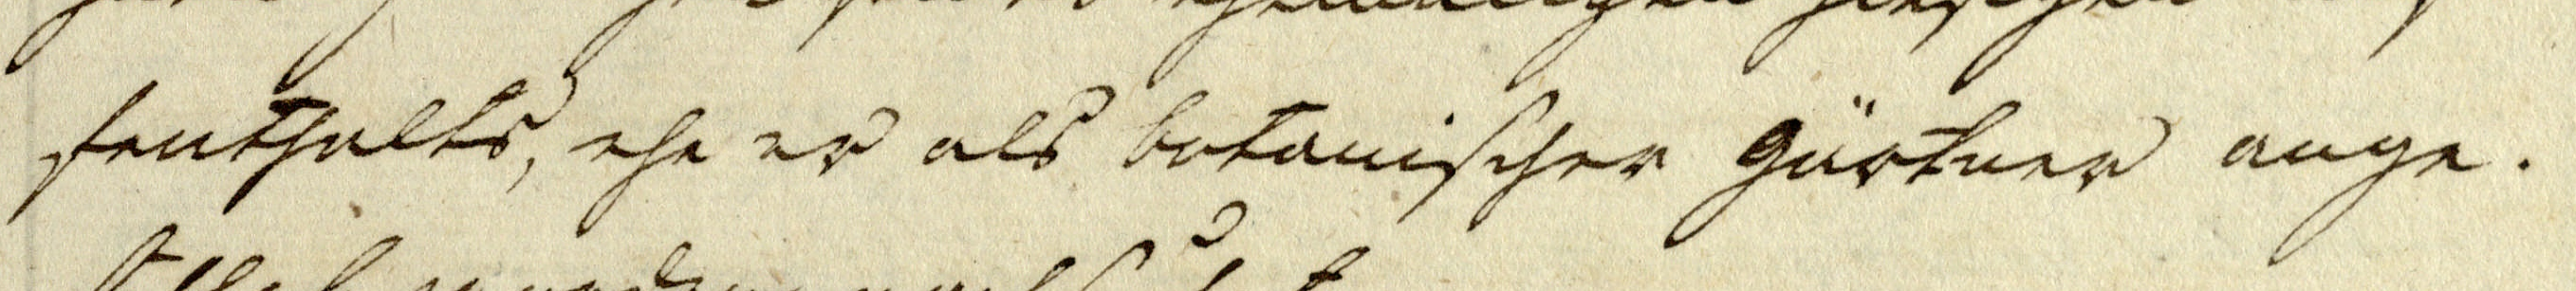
fenthalts, ehe er als botanischer Gärtner ange¬
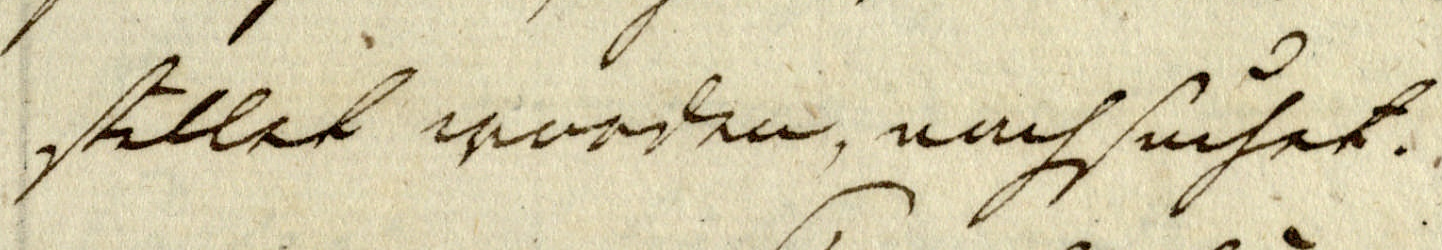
stellet worden, nachsuchet.
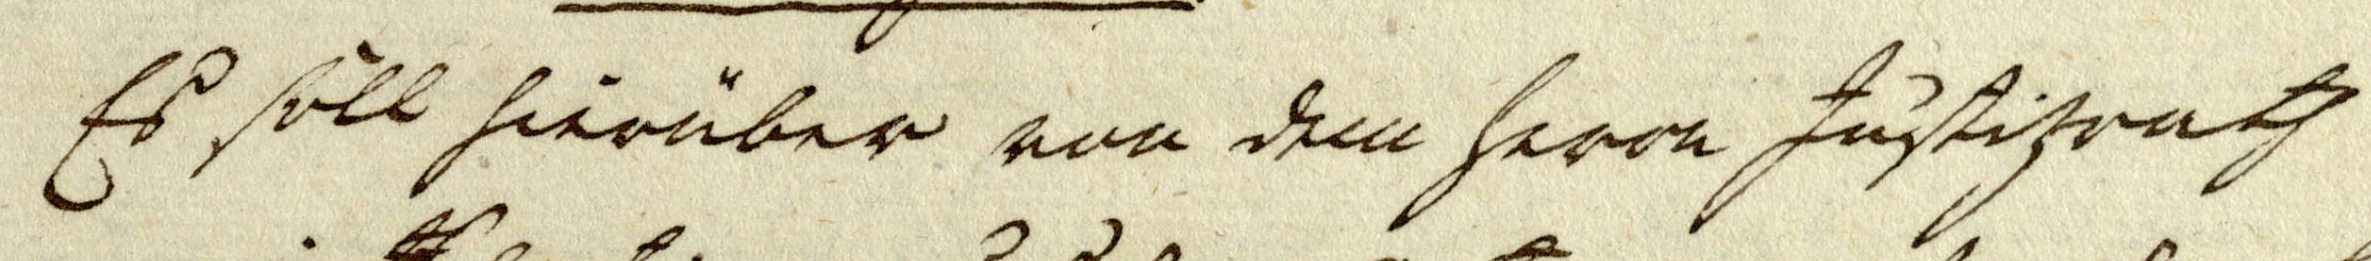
Es soll hierüber von dem Herrn Justizrath
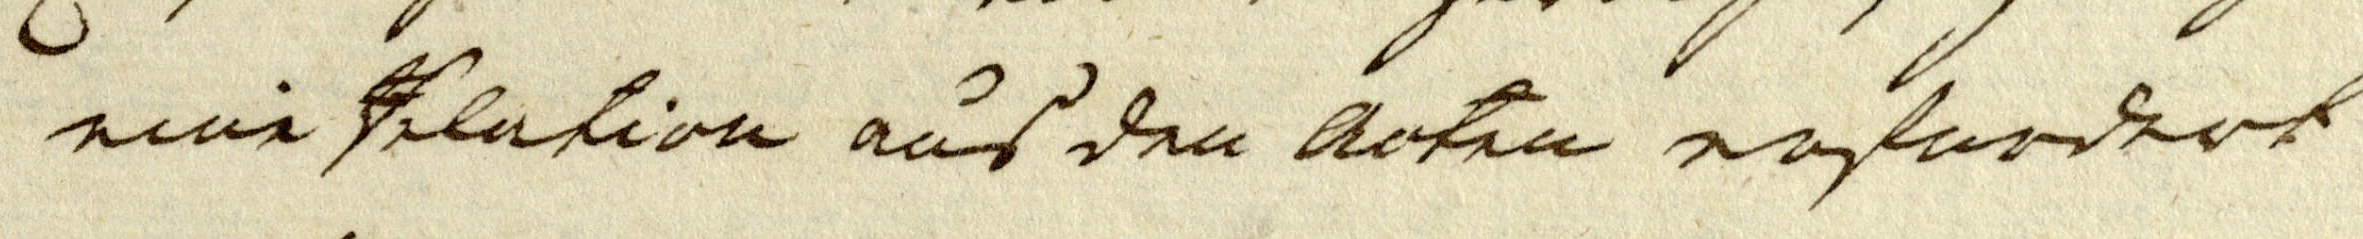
eine Relation aus den Acten erfordert
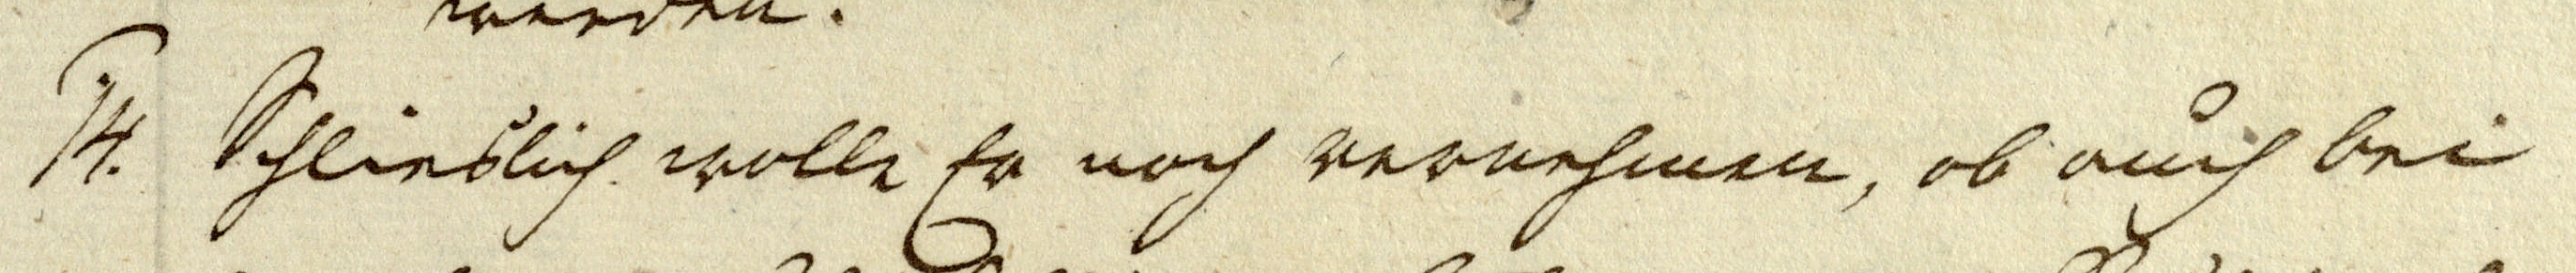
14. Schlieslich wolle Er noch vernehmen, ob auch bei
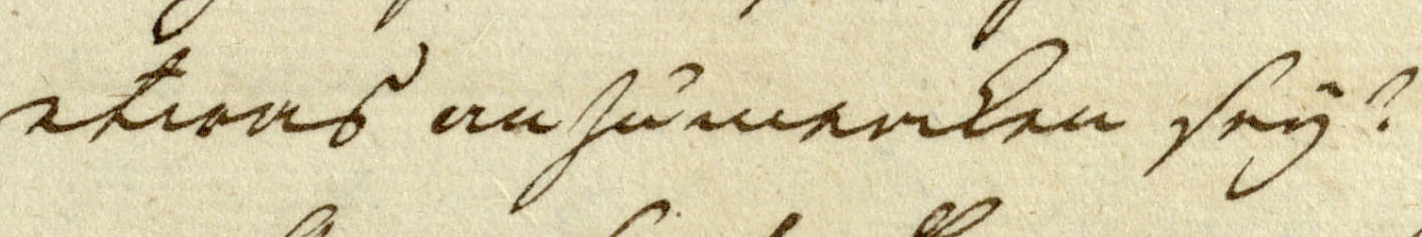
etwas anzumercken seÿ?
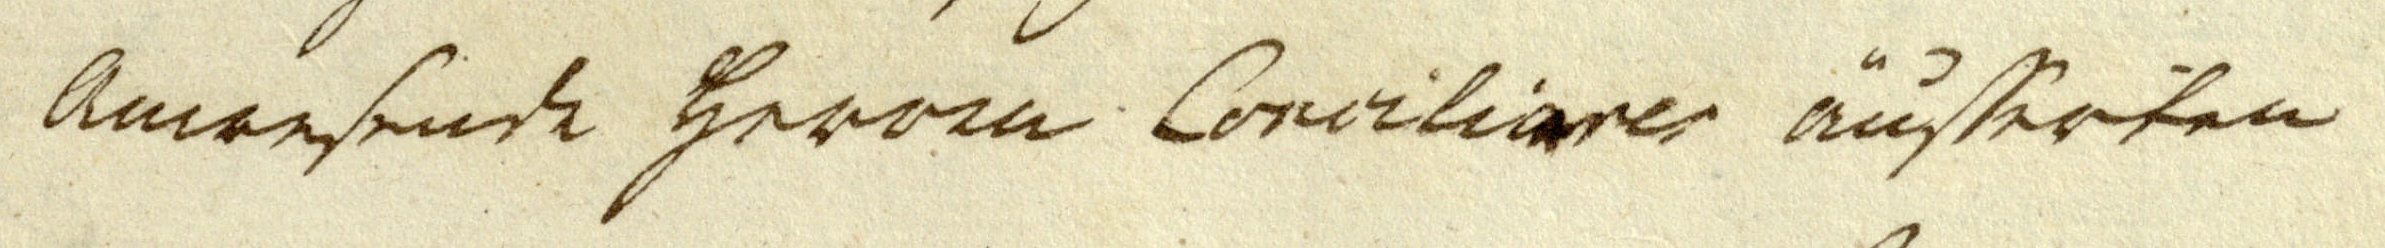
Amwesende Herren Conciliares äusserten
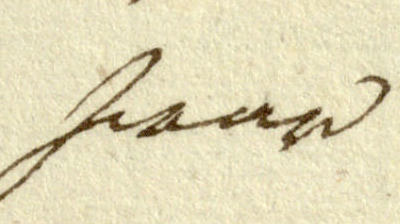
zwar
